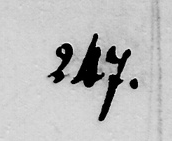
240.
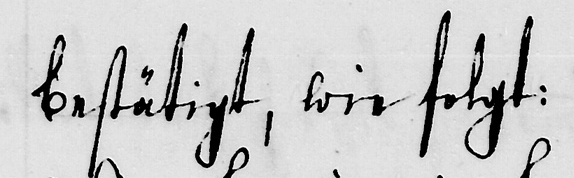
bestätigt, wie folgt:
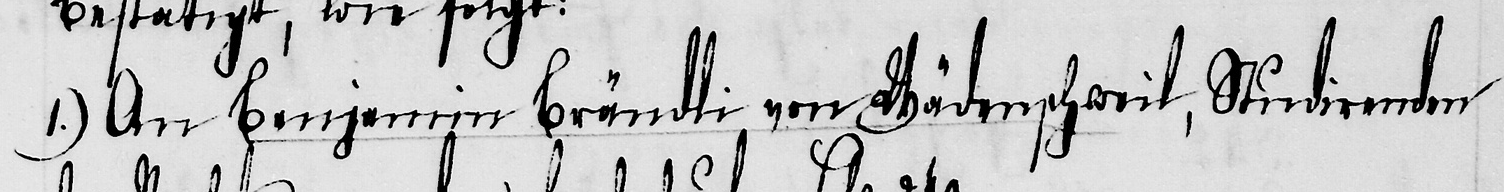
1.) An Benjamin Brändli von Wädenschweil, Studirenden
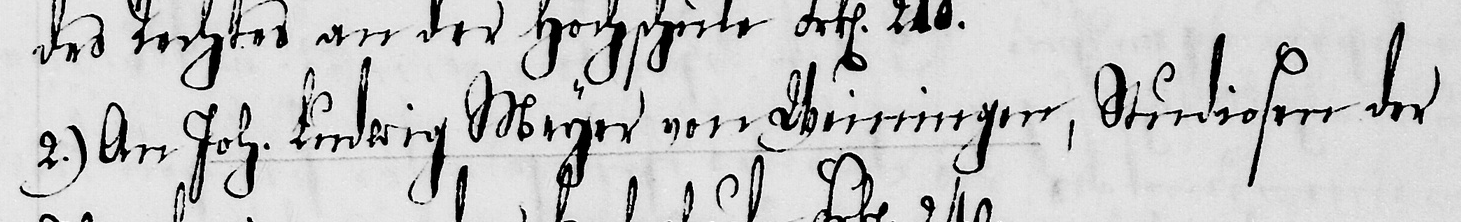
2.) An Joh. Ludwig Meyer von Weiningen, Studiosen der
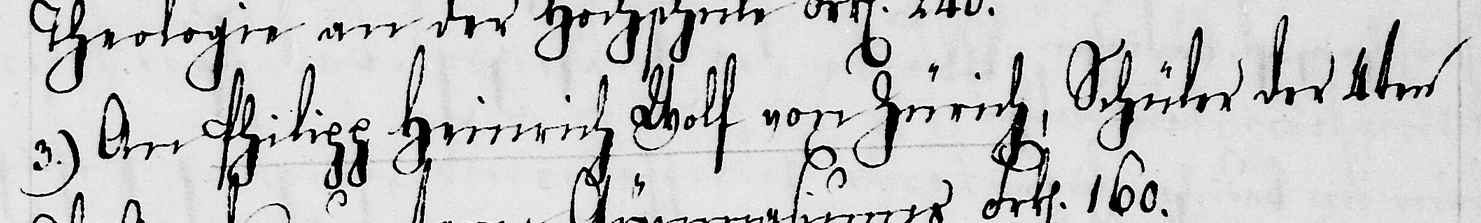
3.) An Philipp Heinrich Wolf von Zürich, Schüler der 4ten
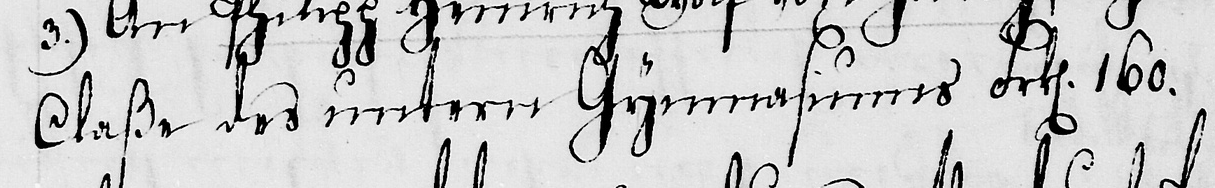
Claße des untern Gymnasiums Frk[en]. 160.
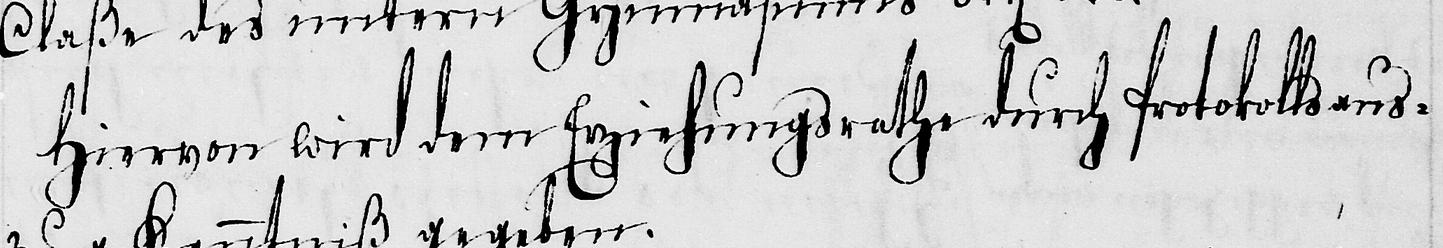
Hiervon wird dem Erziehungsrathe durch Protokollsau¬
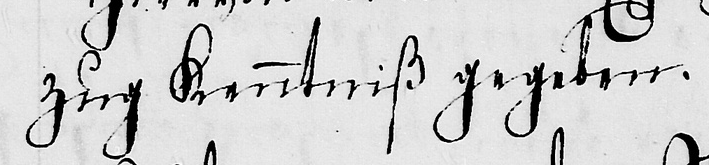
szug Kenntniß gegeben.
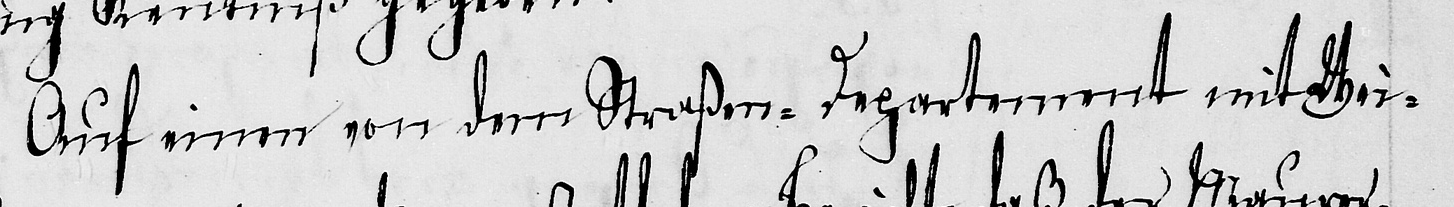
Auf einen von dem Straßen-Departement mit Wei¬
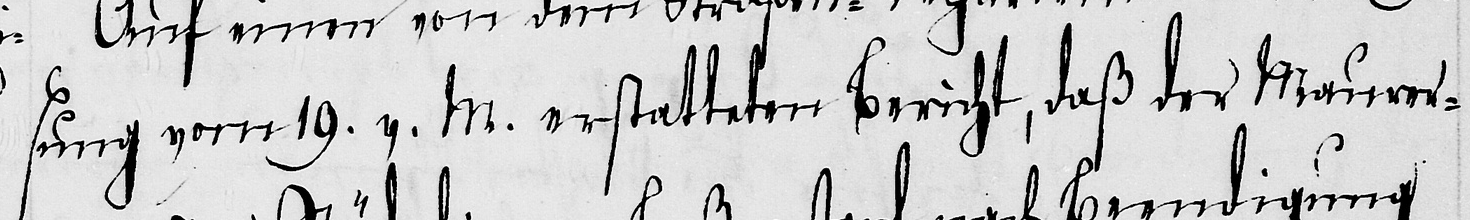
sung vom 19. v. M. erstatteten Bericht, daß der Maurer¬
